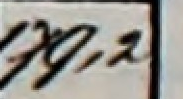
179,2
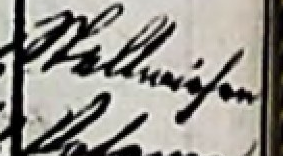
Stellwieser
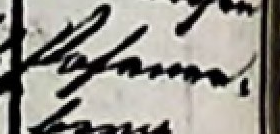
Johann„
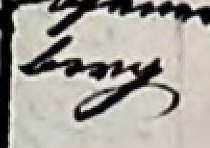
berg
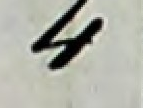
4
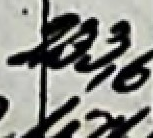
233,6
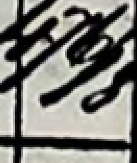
476,8
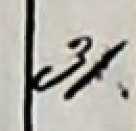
31
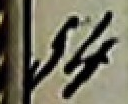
54
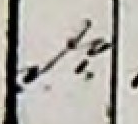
Do
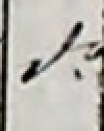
Do
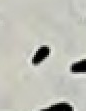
„
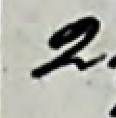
2
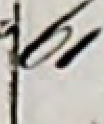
61
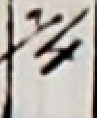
74
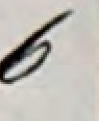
6
